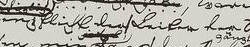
gegenwärtigen Leiter der Unter-
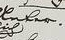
nehmg.
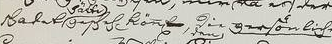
schadet hätte geschehen könnte en, die persönliche
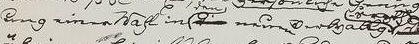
ung einer Wahl in dieden neuen Verwaltungsrathdie
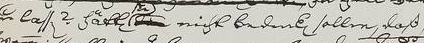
zu lassen? Hätten Siesie nicht bedenken sollen, daß,
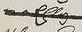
nothwendig
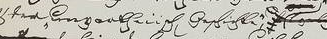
der «unpartheiischen Geschichte», auf vonwelchen
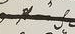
werden mu
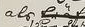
als träfe
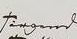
† irgend
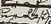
† irgend
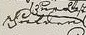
schulden zur
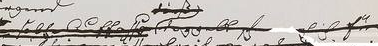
terlassg., welche zu einer solchen Auffassg.
